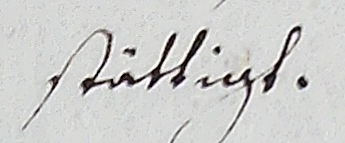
stätigt.
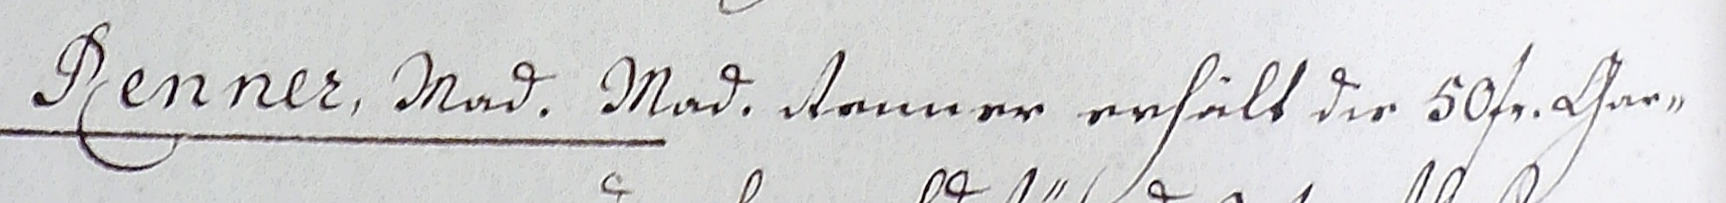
Renner, Mad. Mad. Renner erhält die 50fr. Gar¬
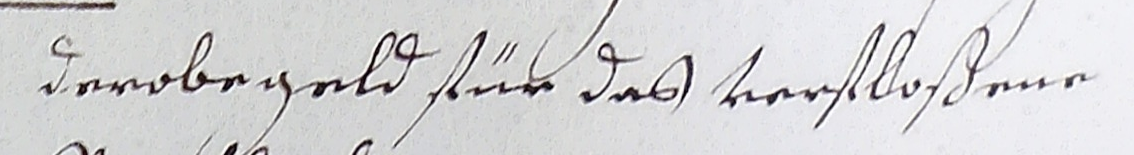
derobegeld für das verfloßene
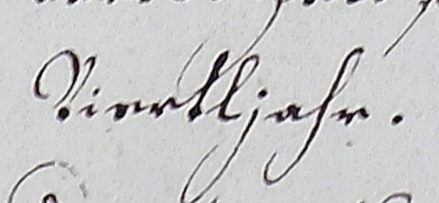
Viertljahr.
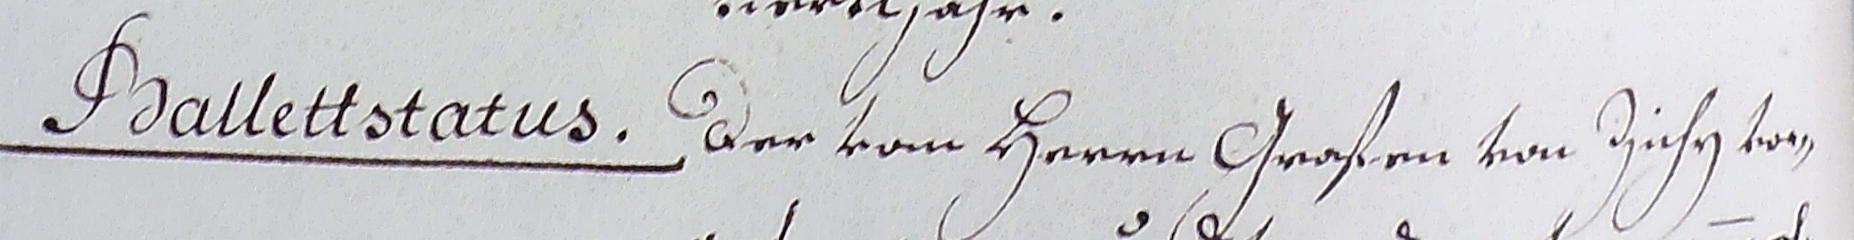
Ballettstatus. Der von Herrn Grafen von Zichy vor¬
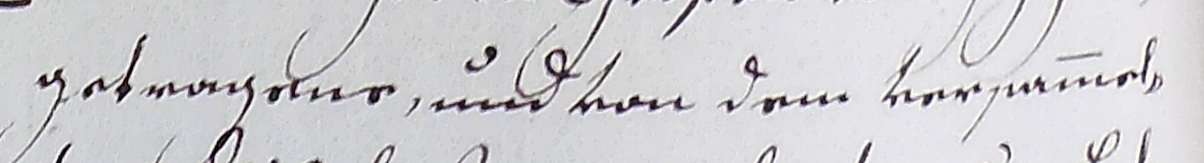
getragene, und von dem versam̅el¬
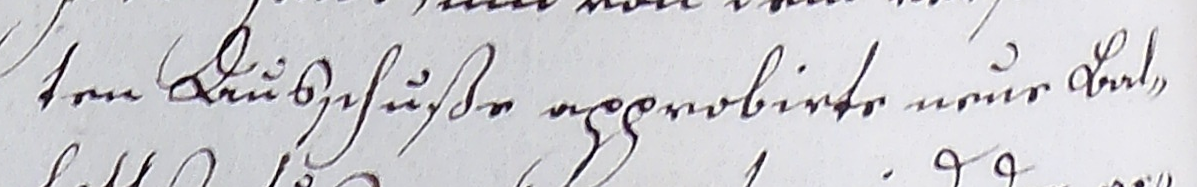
ten Auschuße approbirte neue Bal¬
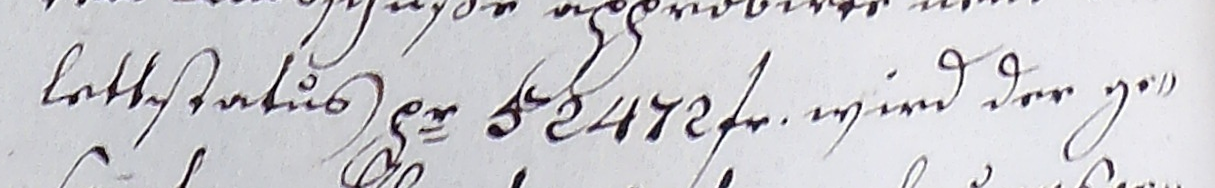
lettstatus pr͇ 52472fr. wird der ge¬
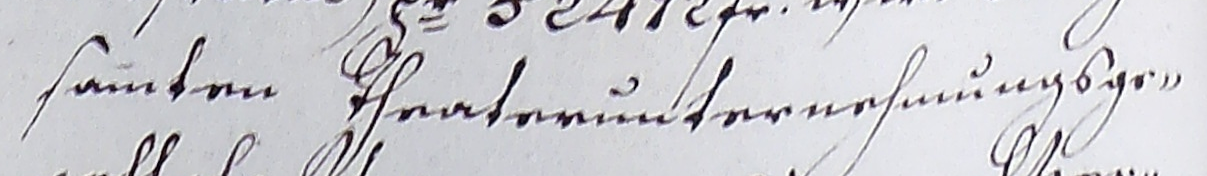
sam̅ten Theaterunternehmungsge¬
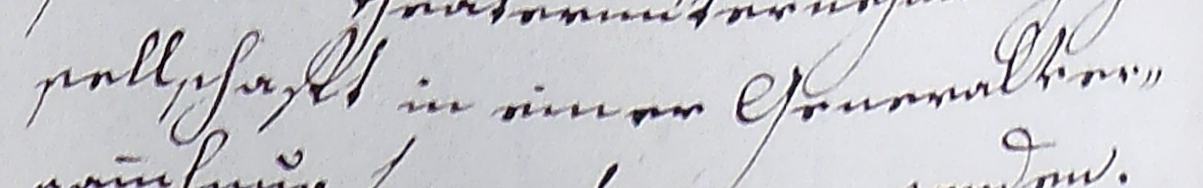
sellschaft in einer Generalver¬
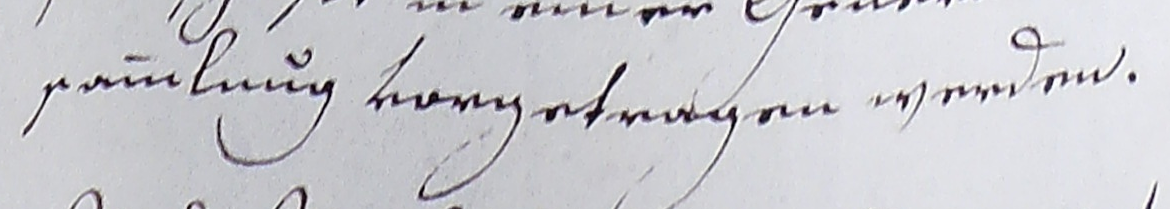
sam̅lung vorgetragen werden.
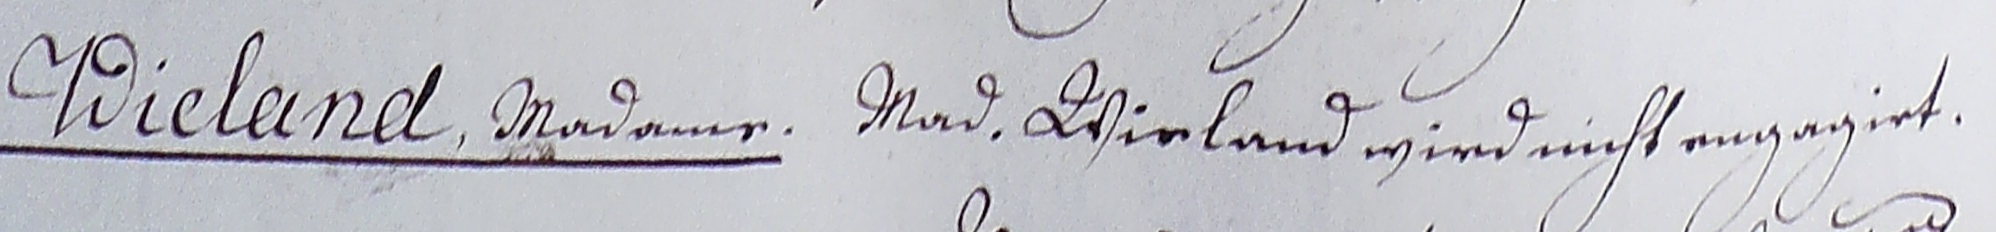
Wieland, Madame. Mad. Wieland wird nicht engagirt.
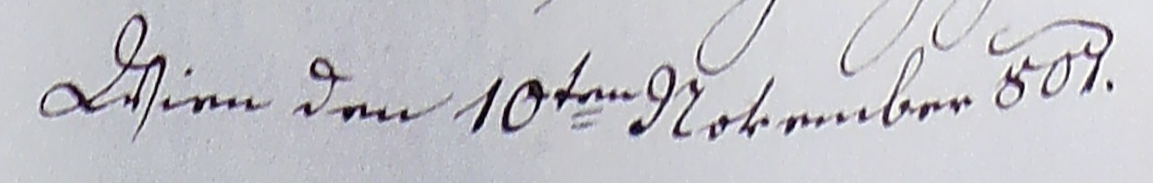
Wien den 10te͇n November 8͞0͞7.
